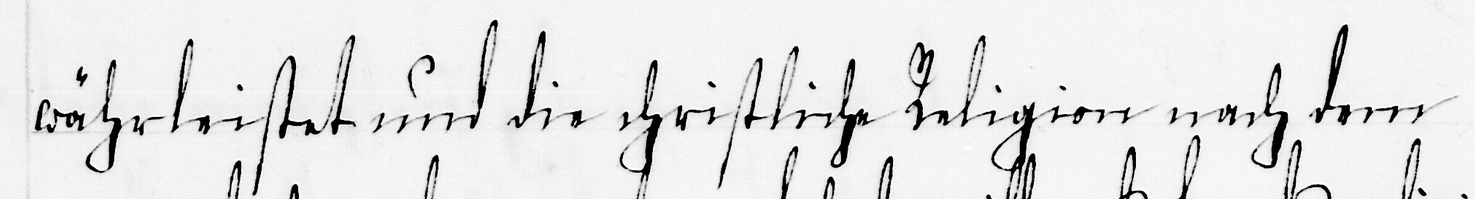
währleistet und die christliche Religion nach dem
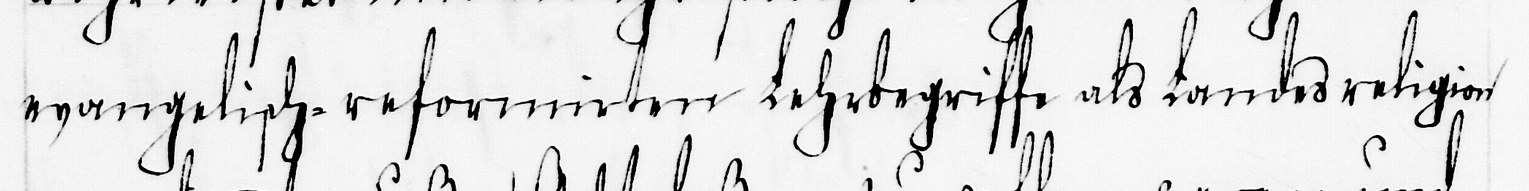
evangelisch-reformirten Lehrbegriffe als Landesreligion
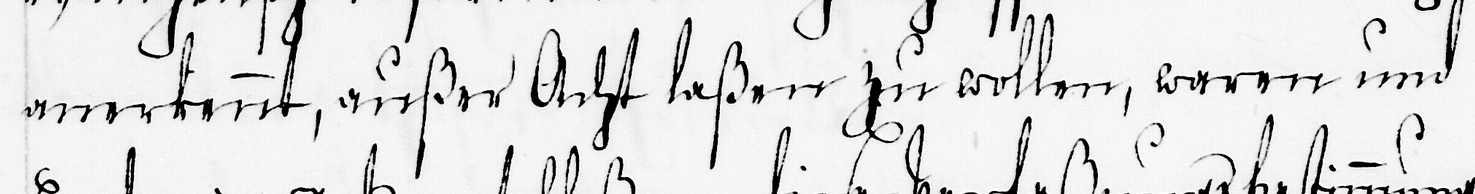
anerkennt, außer Acht laßen zu wollen, waren und
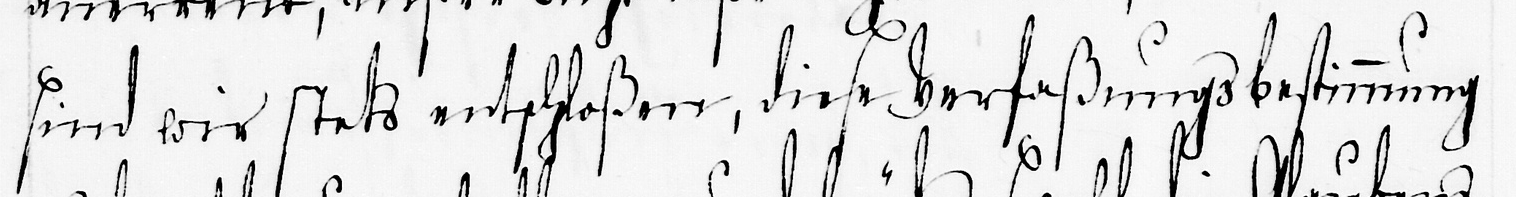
sind wir stets entschloßen, diese Verfaßungsbestimmung
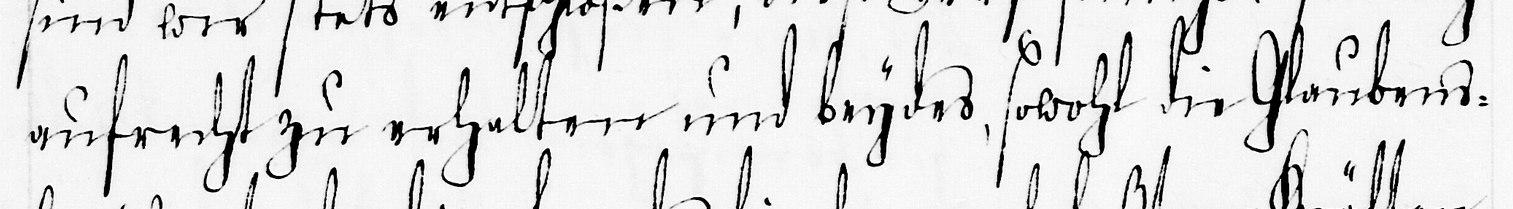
aufrecht zu erhalten und beydes, sowohl die Glaubens¬
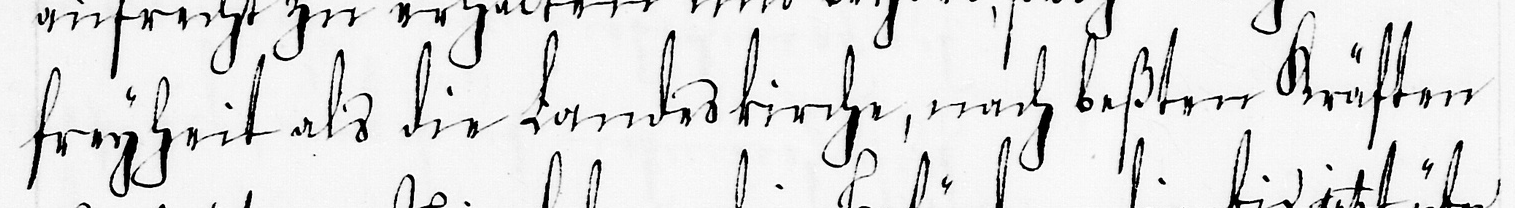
freyheit als die Landeskirche, nach beßten Kräften
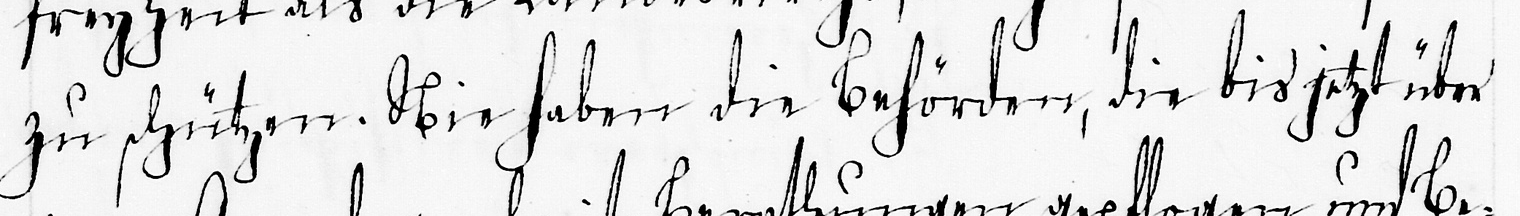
zu schützen. Nie haben die Behörden, die bis jetzt über
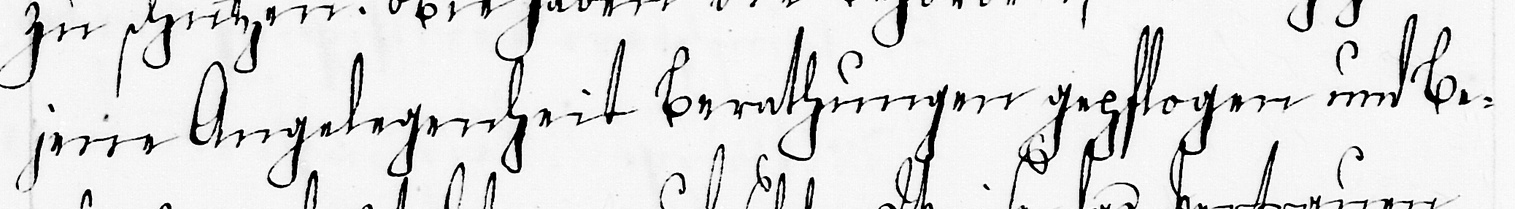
jene Angelegenheit Berathungen gepflogen und Bes¬
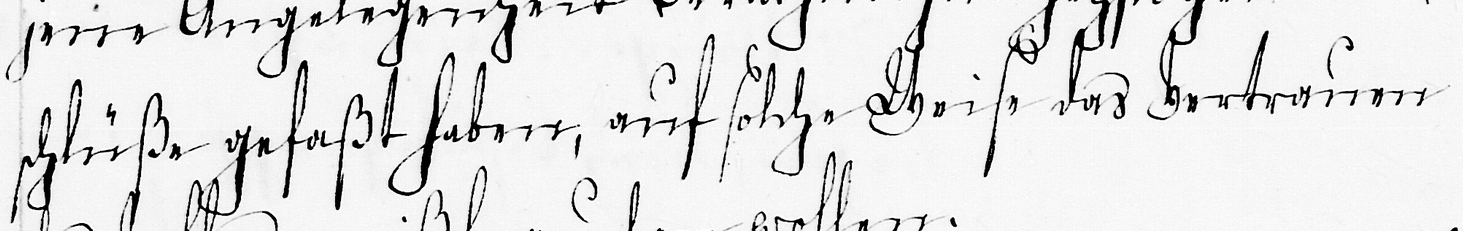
chlüße gefaßt haben, auf solche Weise das Vertrauen
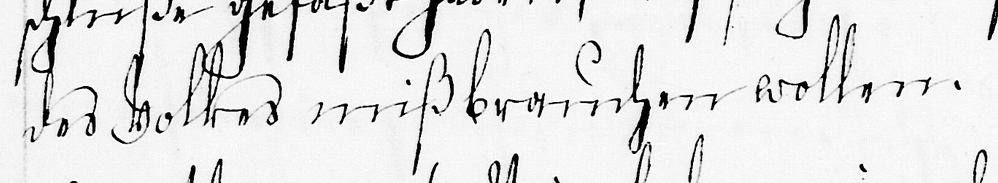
des Volkes mißbrauchen wollen.
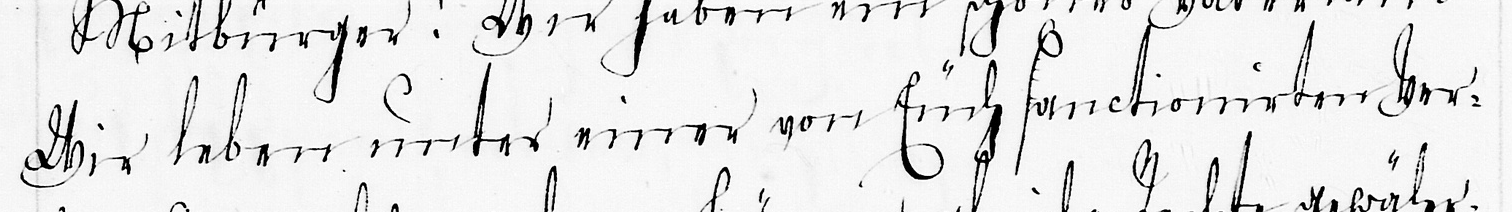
Wir haben unter einer von Euch sanctionirten Ver¬
